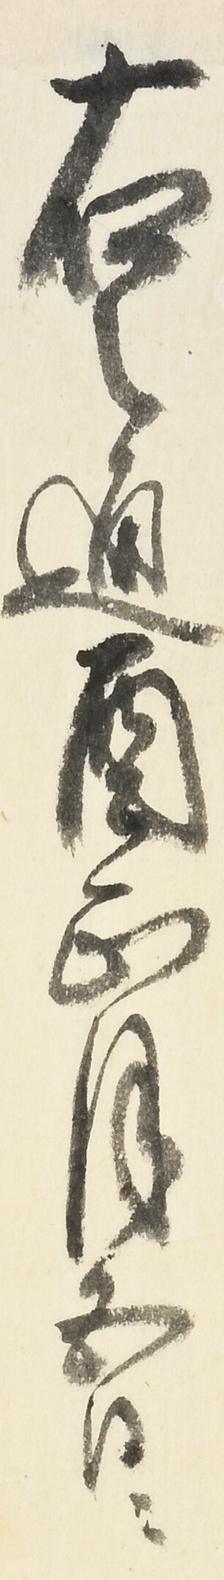右之通酉正月五日ニ

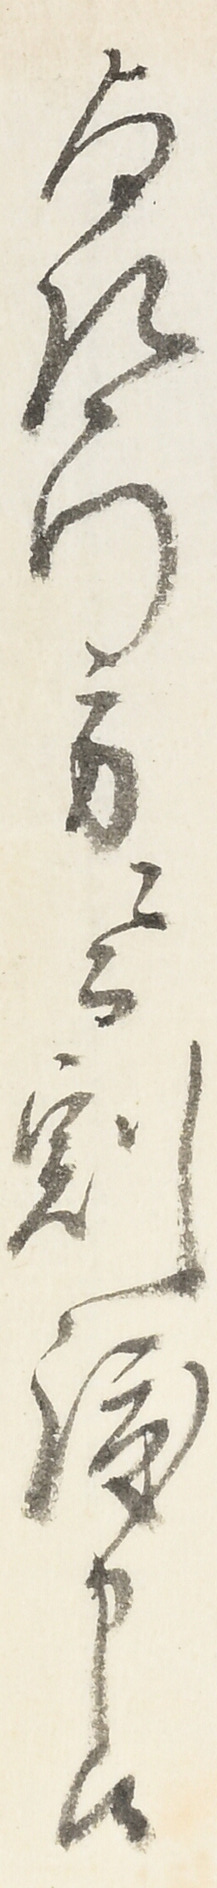与左衛門方ニ而割渡申候
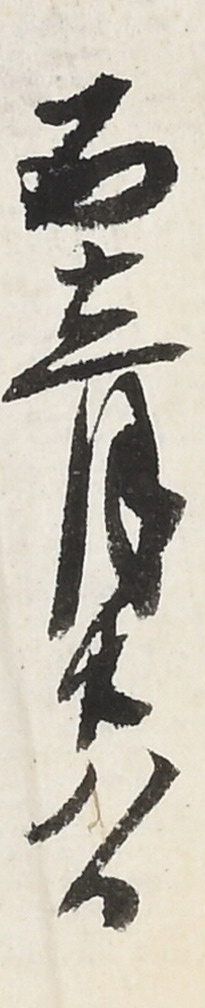酉十二月廿八日
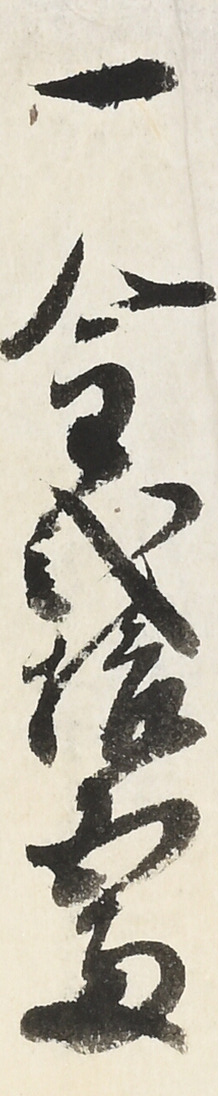一金弐拾五両
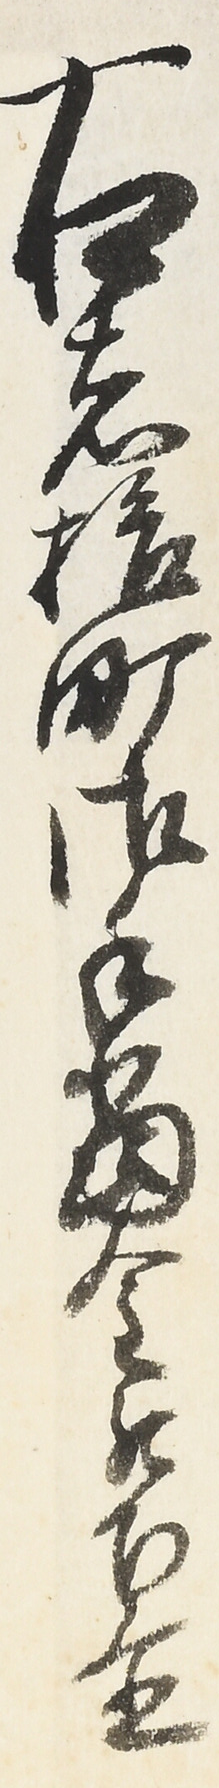右者横町御手当金被下置
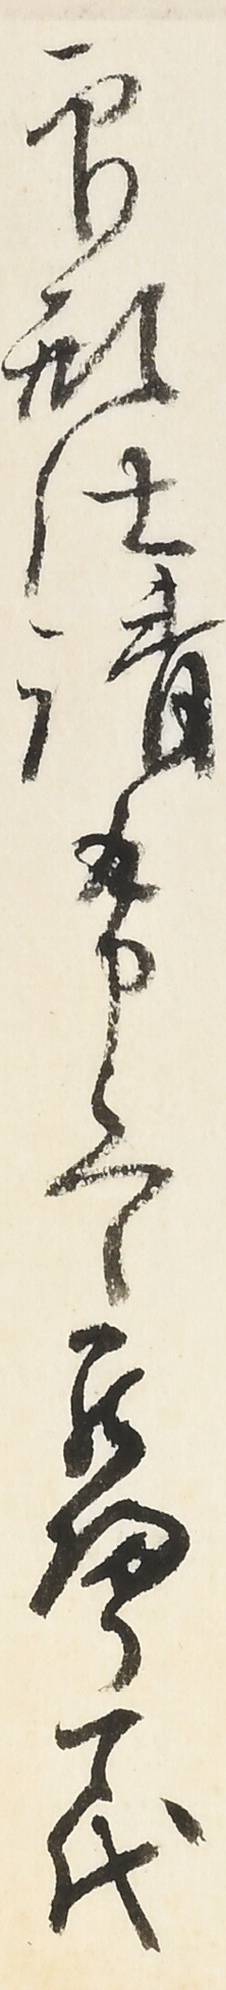印形仕請取申上候罷帰り丁代
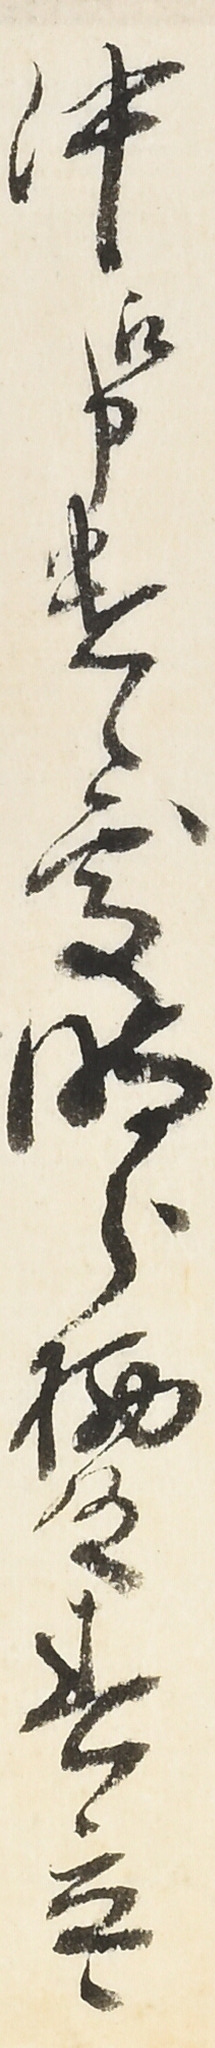中江申遺候處時分柄殿春立候
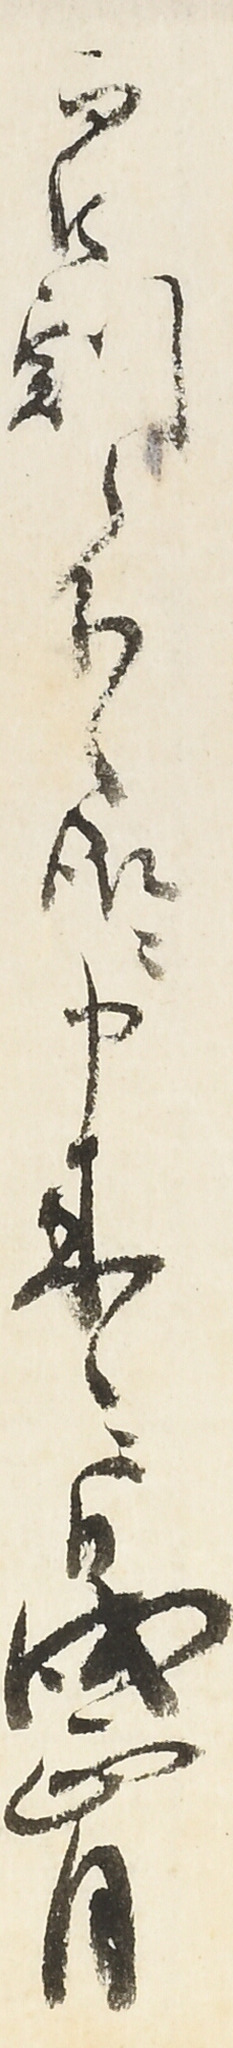而被割り下候様ニ申来候ニ而戌正月
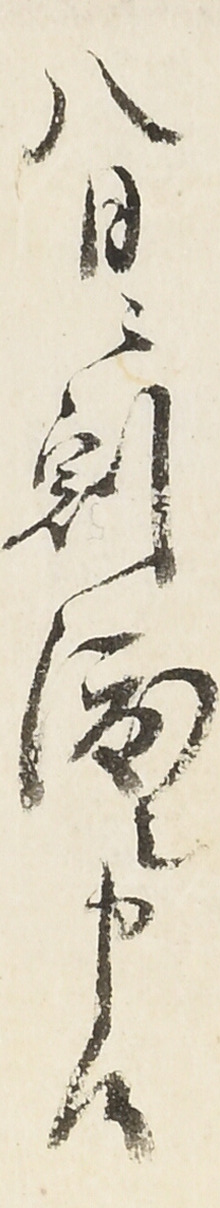八日割渡し申候
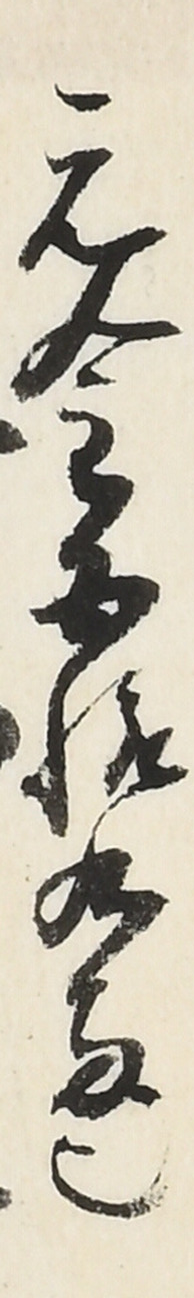元金五拾九両也
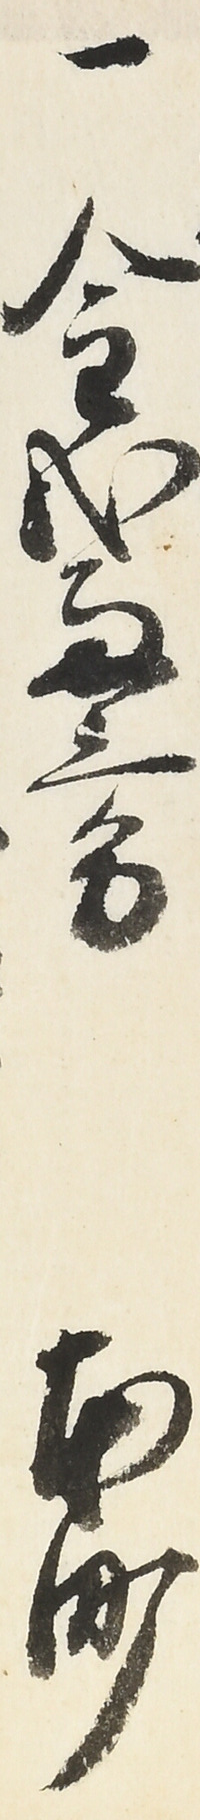一金弐両三分本町
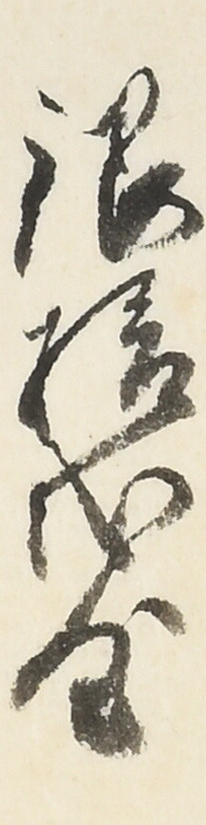銀拾弐匁
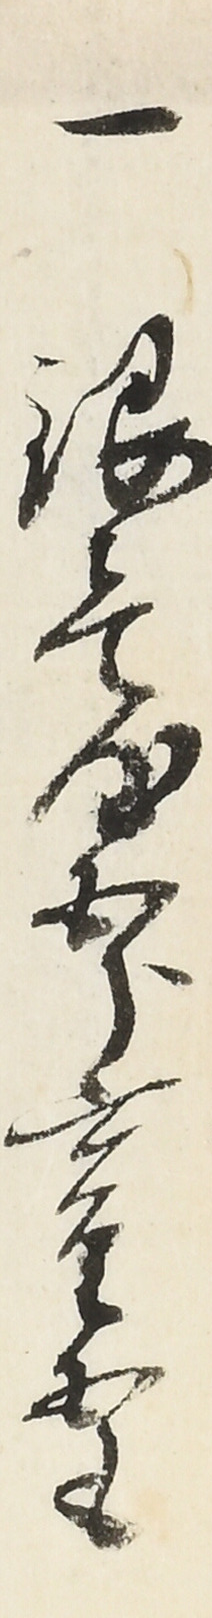一銀壱匁五分六厘五毛
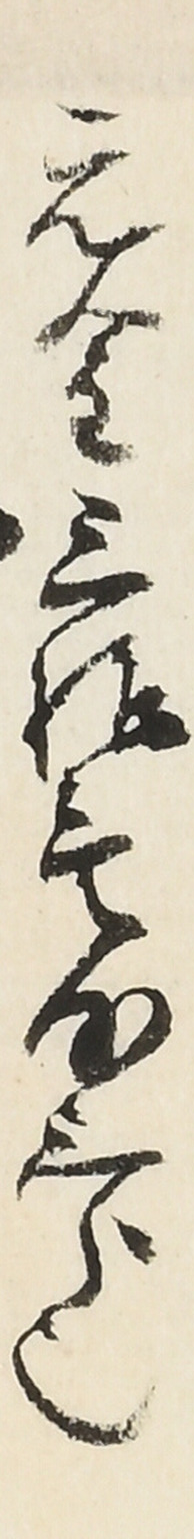元金三拾壱匁三分也
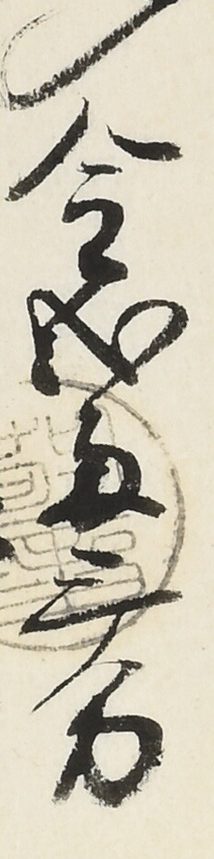〆金弐両三分分
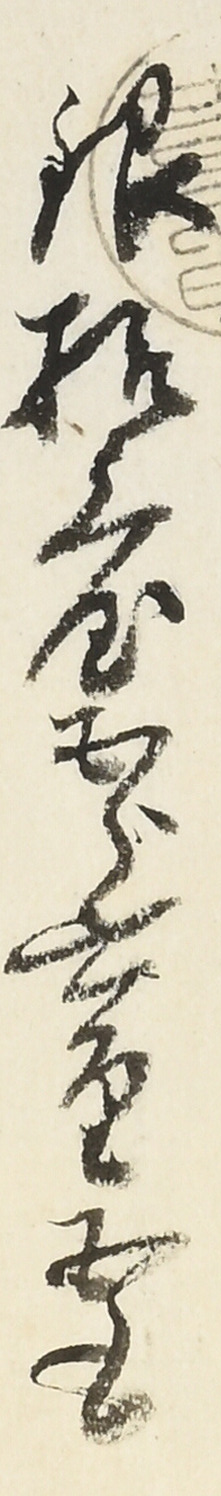銀拾三匁五分六厘五毛
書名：御才覚金御利足割渡扣帳
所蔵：伊那市立高遠町図書館・合同会社AMANE
